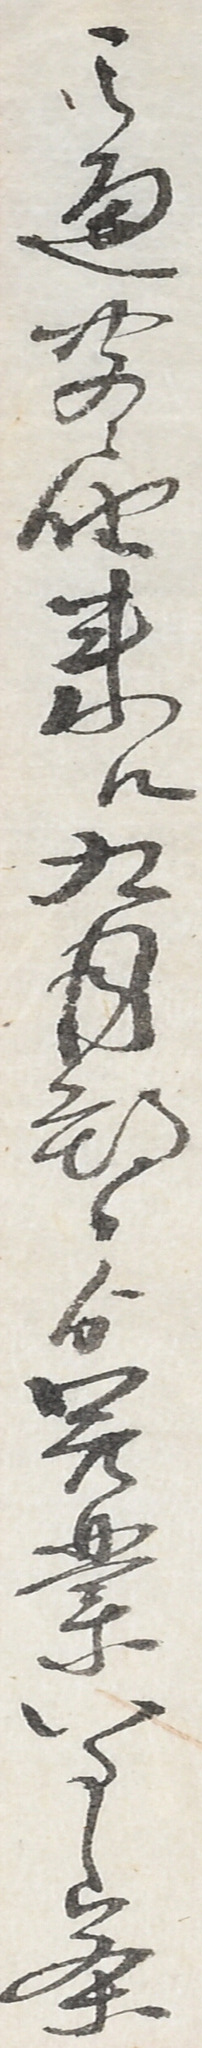之通聞届来る九月朔日より開業いたし候条
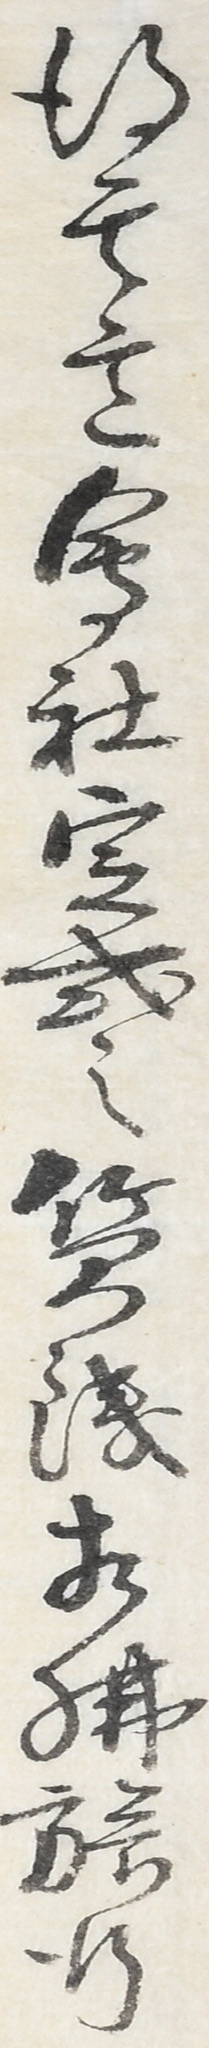得其意会社定式之賃銭相払旅行

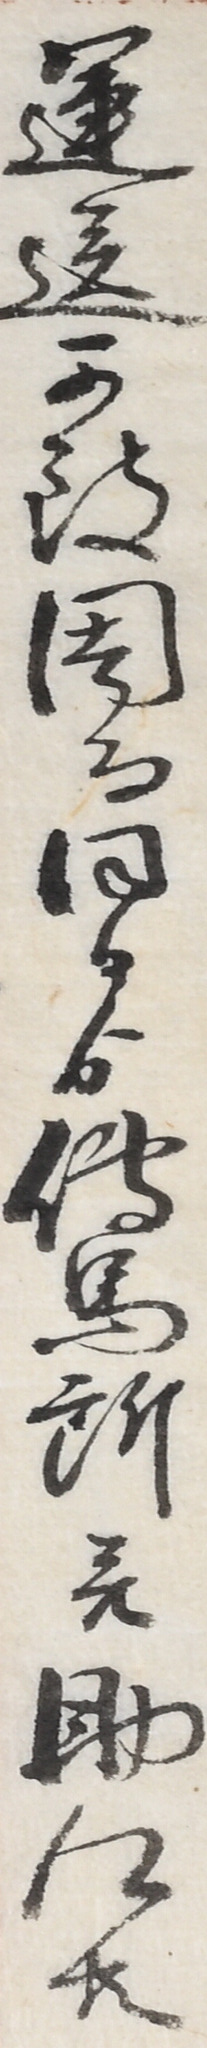運送可致因て同日より伝馬所并助郷共
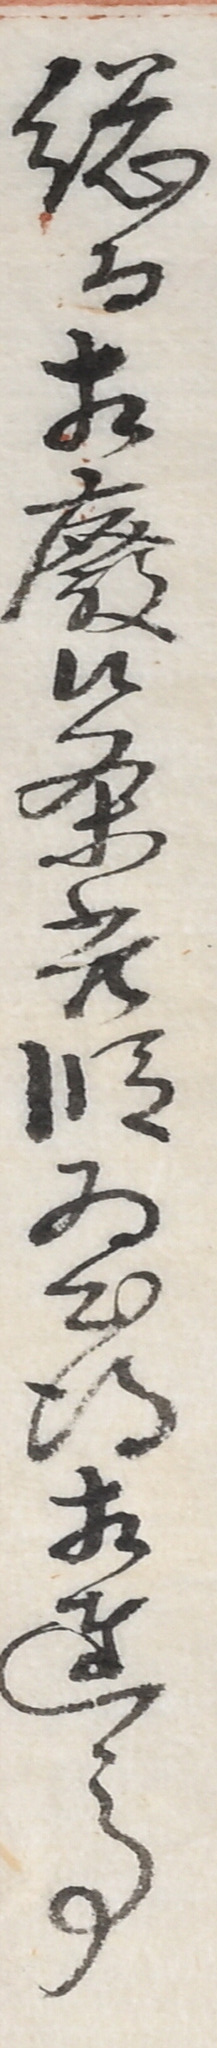総て相廃候条此段為心得相達候事
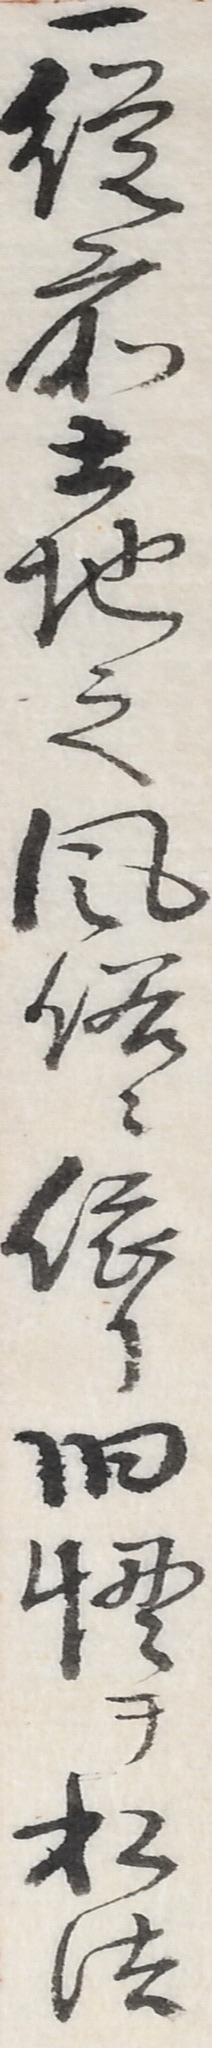一従前土地之風俗ニ依リ旧慣を私法
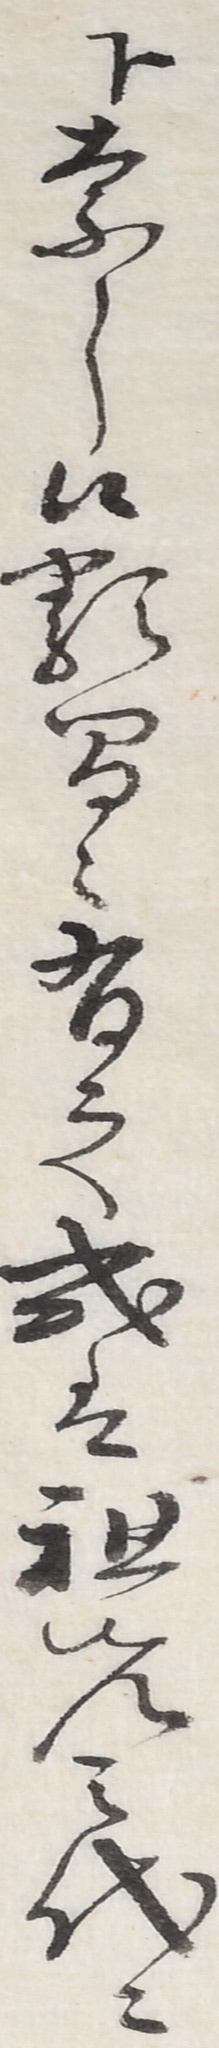トなし候類間々有之或は祖先之代に
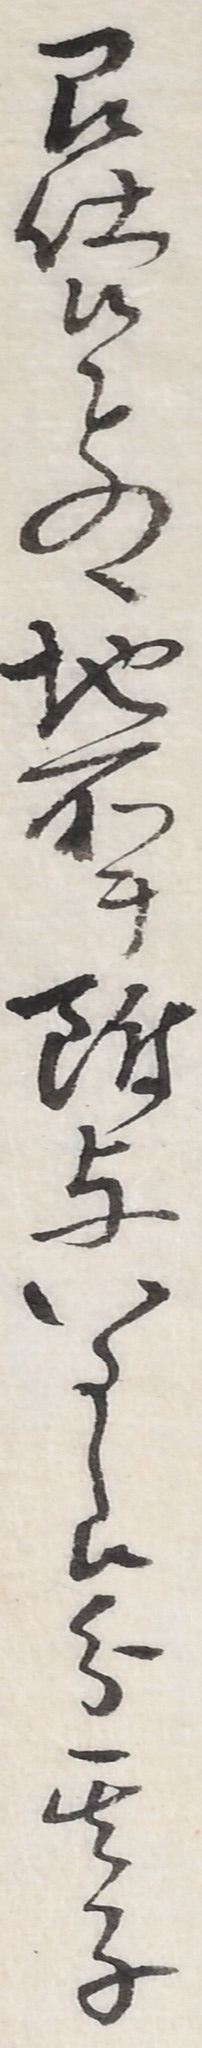召仕候ものゝ地所ヲ附与いたし候分其子
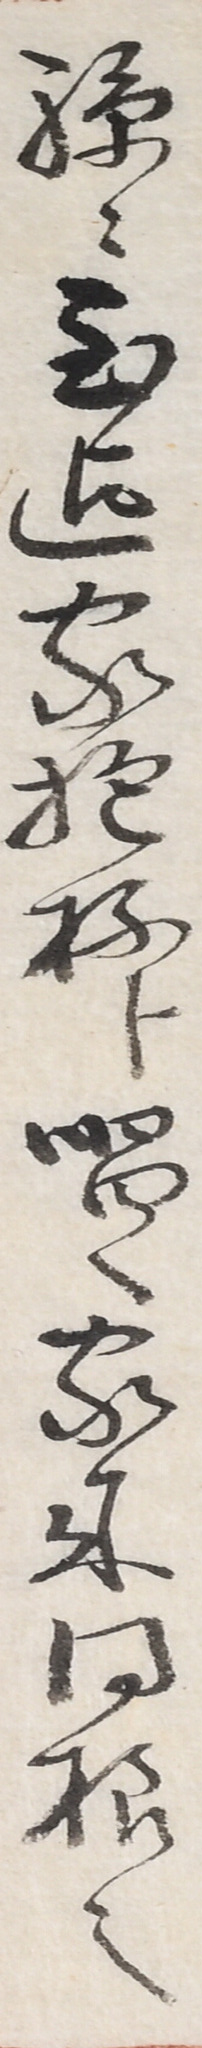孫に至迄家抱抔と唱へ家来同様之
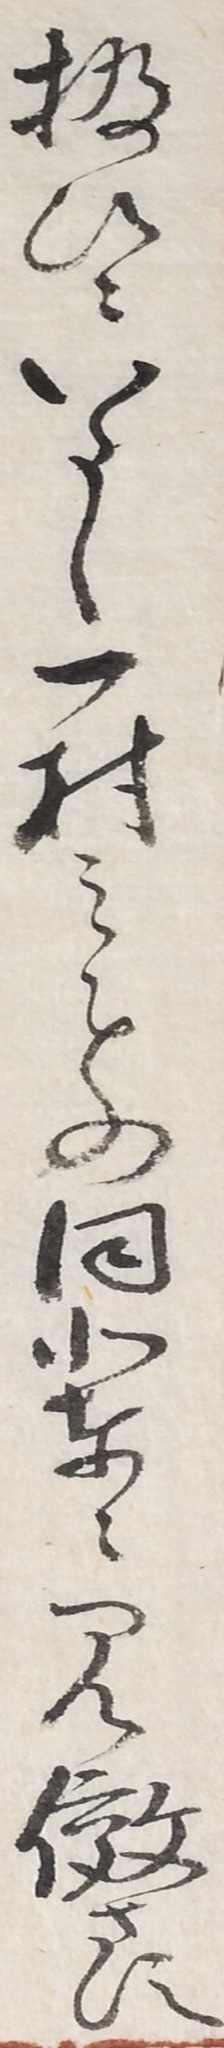扱ひにいたし一村之もの同輩ニ見傚さす
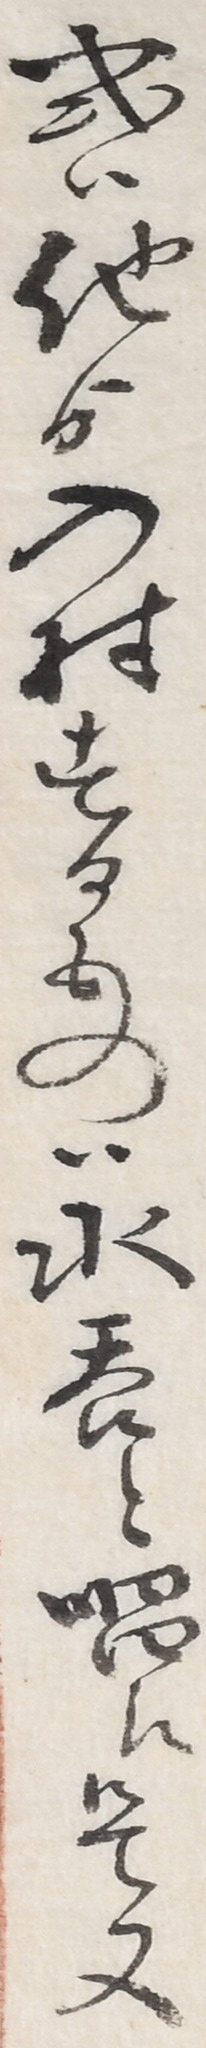或は他より入村するものは水呑と唱え是又
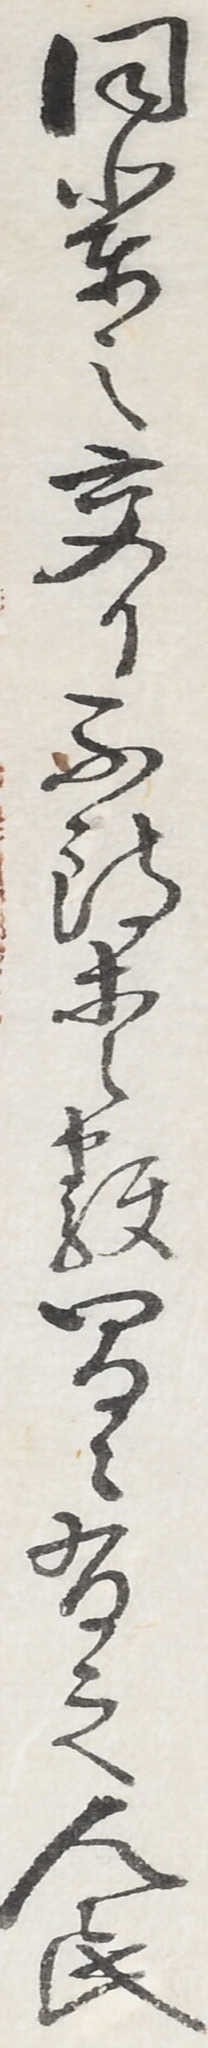同輩之交り不致等之類間々有之人民
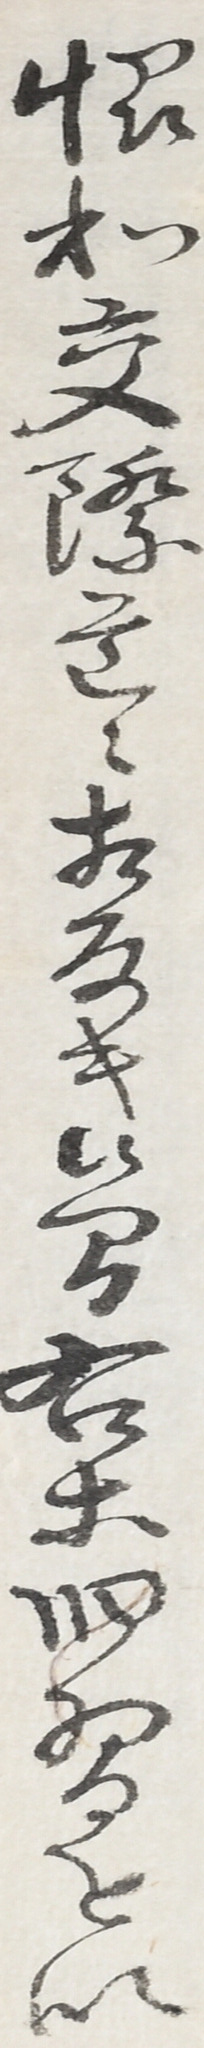恨和交際道に相反き候間右等旧習を以
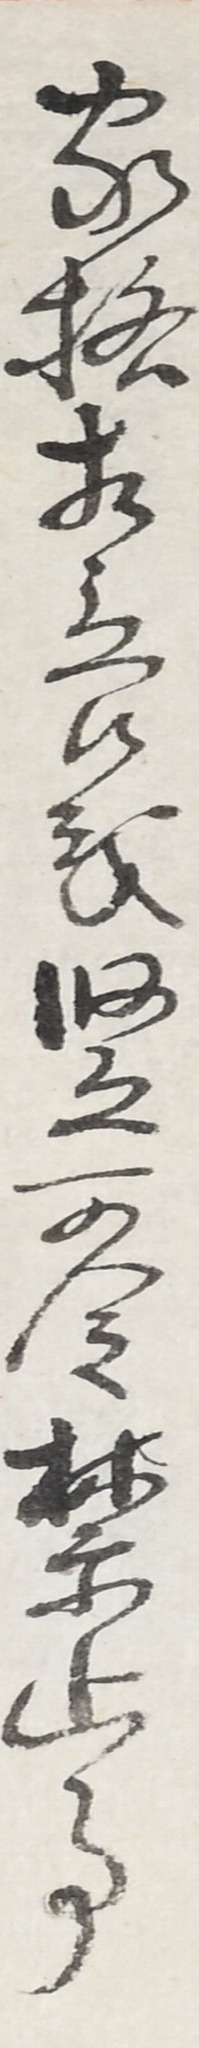家格相立候義堅可令禁止事
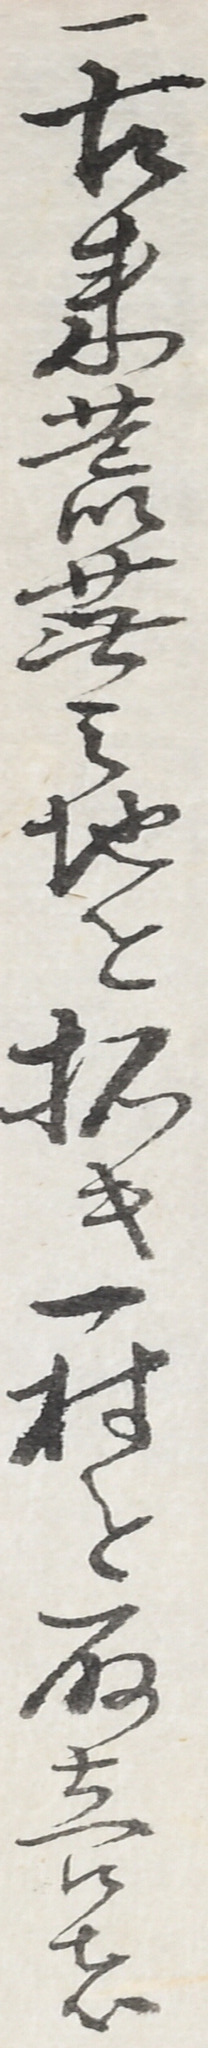一古来荒蕪之地を拓き一村を取立候者
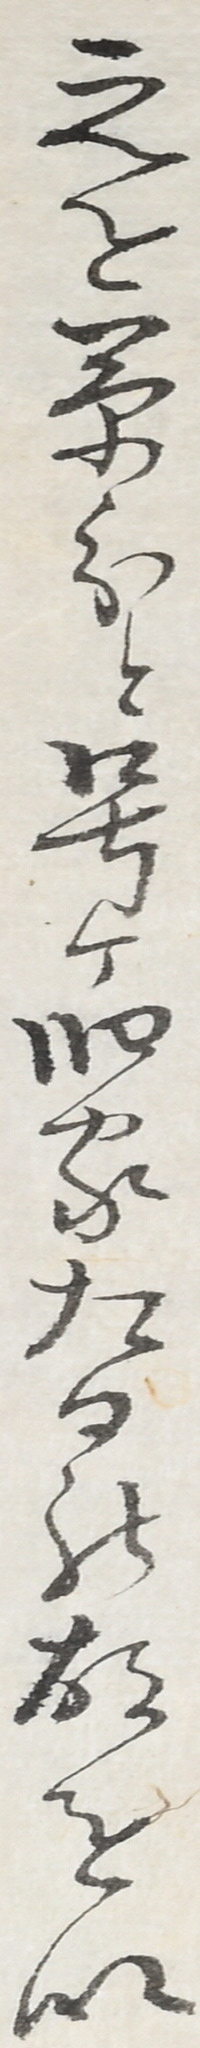元を草分と号け旧家たるの故を以
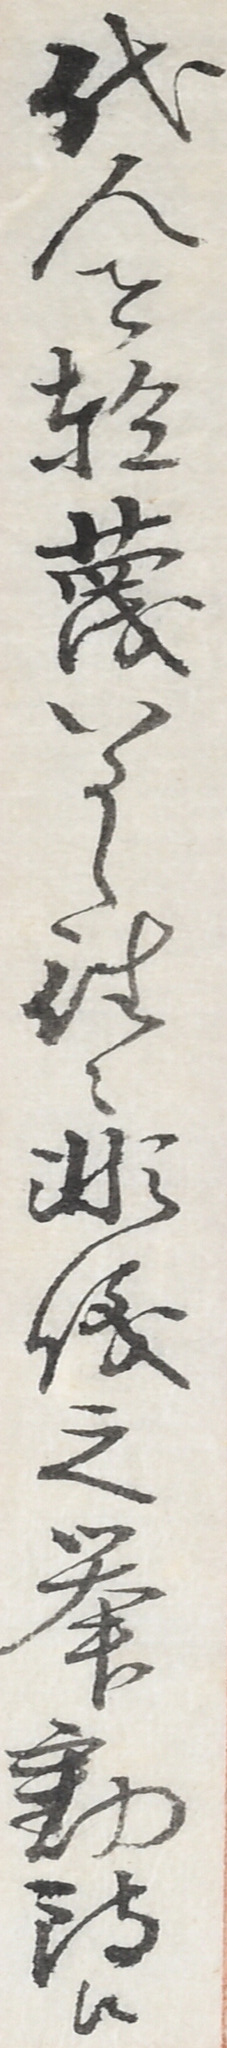代人を軽蔑いたし往々非儀之挙動致候
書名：壹番・御布告一式
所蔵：伊那市立高遠町図書館・合同会社AMANE
